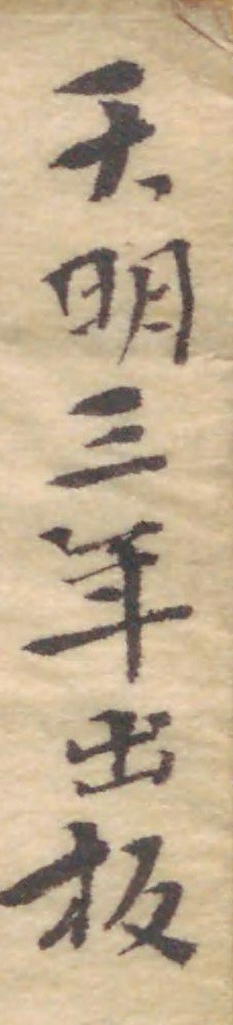天明三年出板

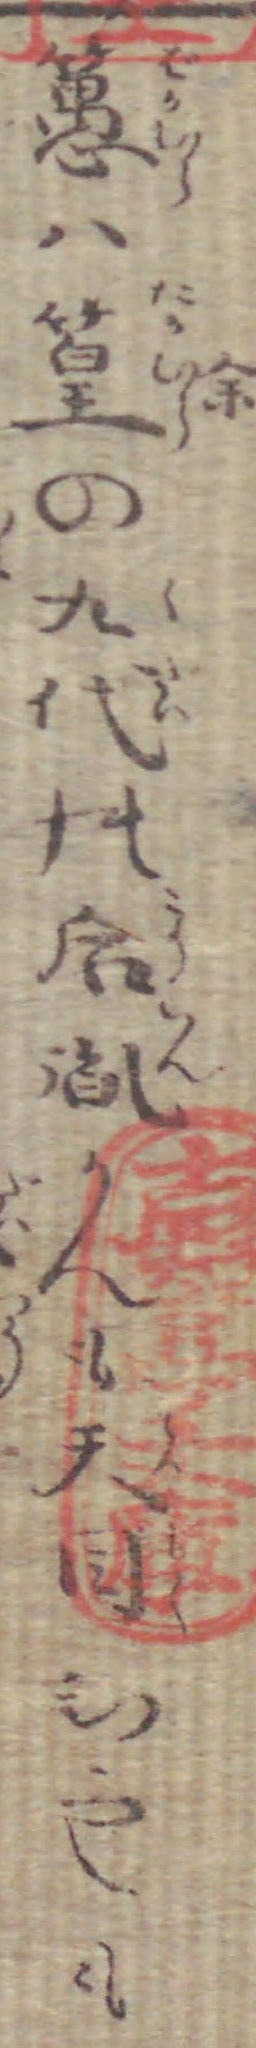𦽳は篁の九代の后胤かんも天目ひやも
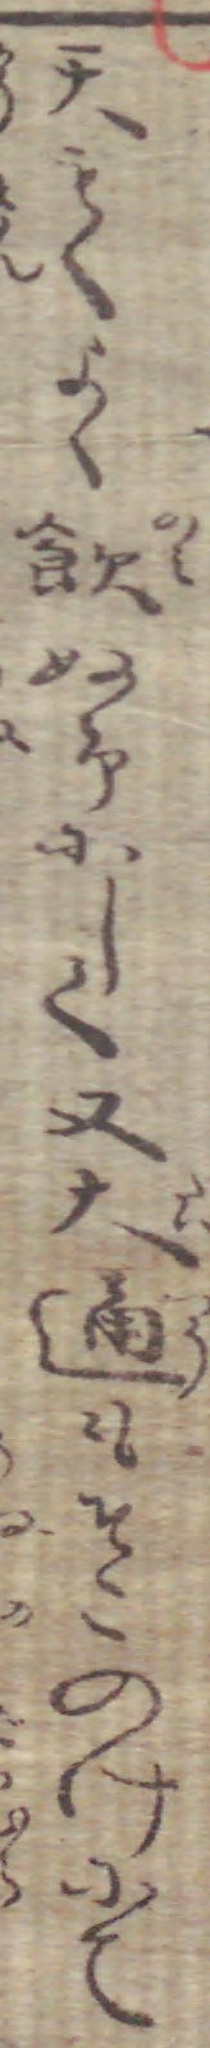天もくよく飲ぬ予にして又大通もそこのけにて
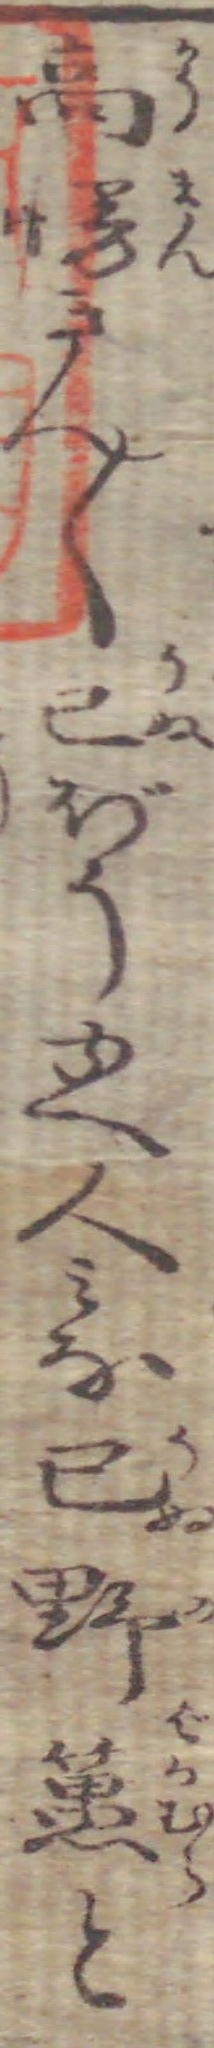高慢きん〳〵己ぼうゆへ人みな己野𦽳と
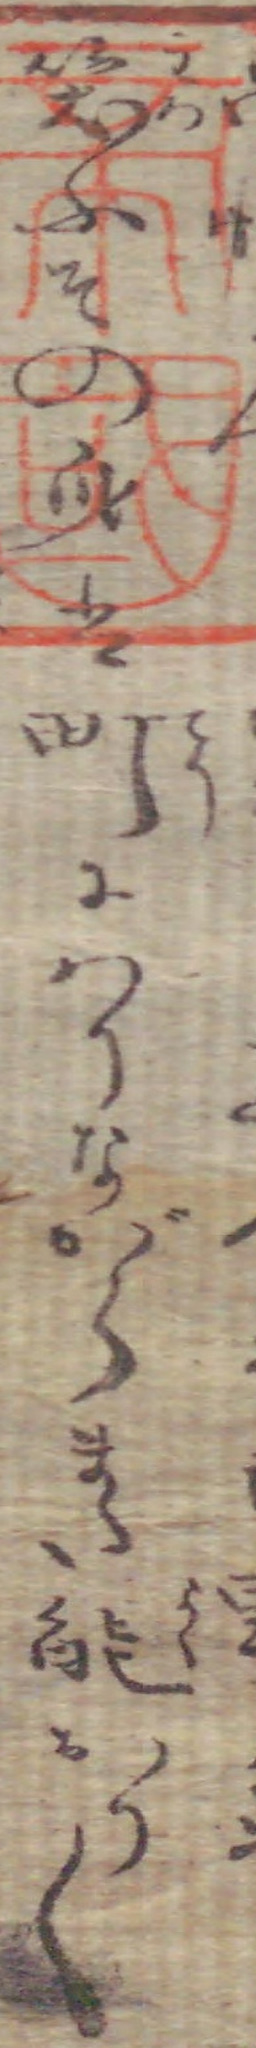笑ふその身は町にはりながらまた能おり〳〵
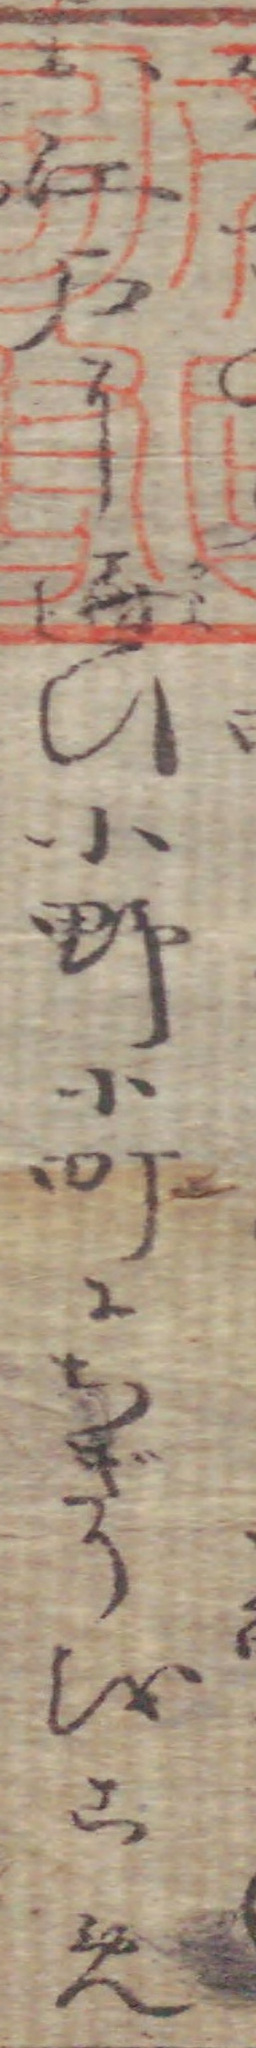お江戸に通ひ小野小町にちぎりをこめ
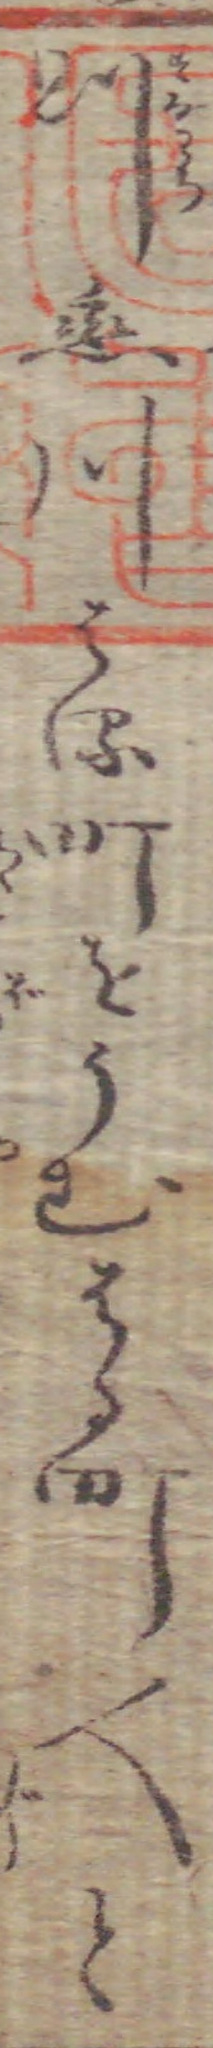則恋川はる町をうむはる町人と
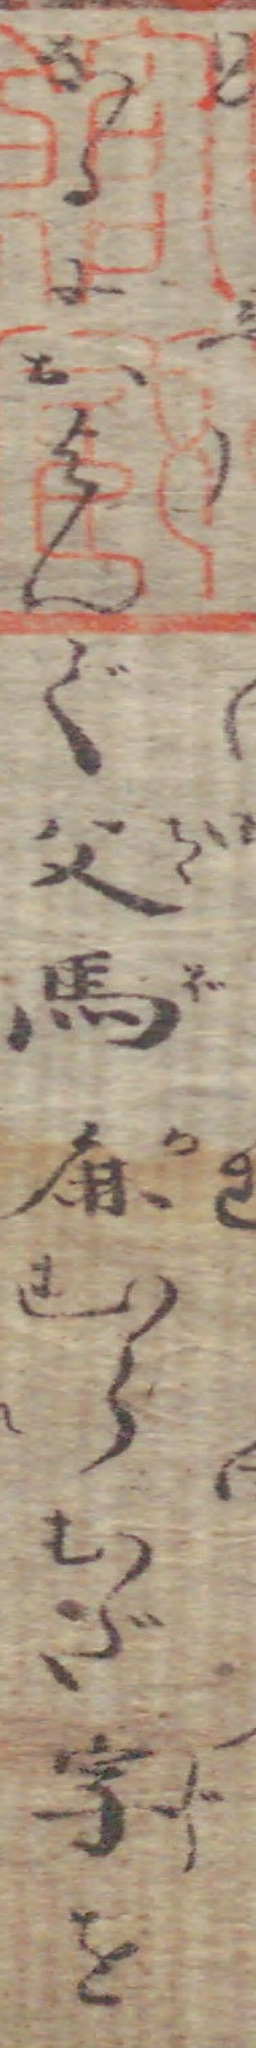なるにおよんで父馬鹿むらむだ字を
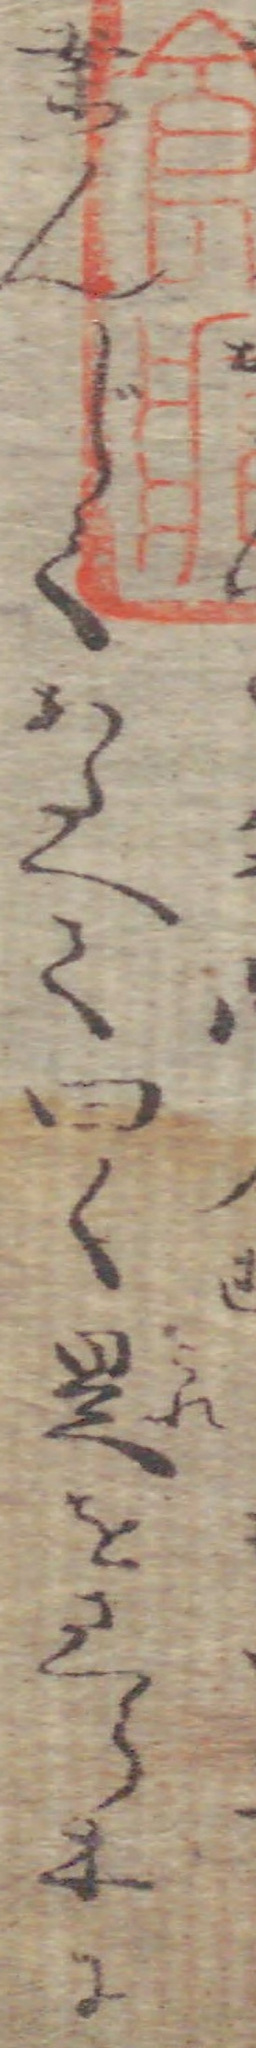案んじてあたへて曰く是をさくら木に
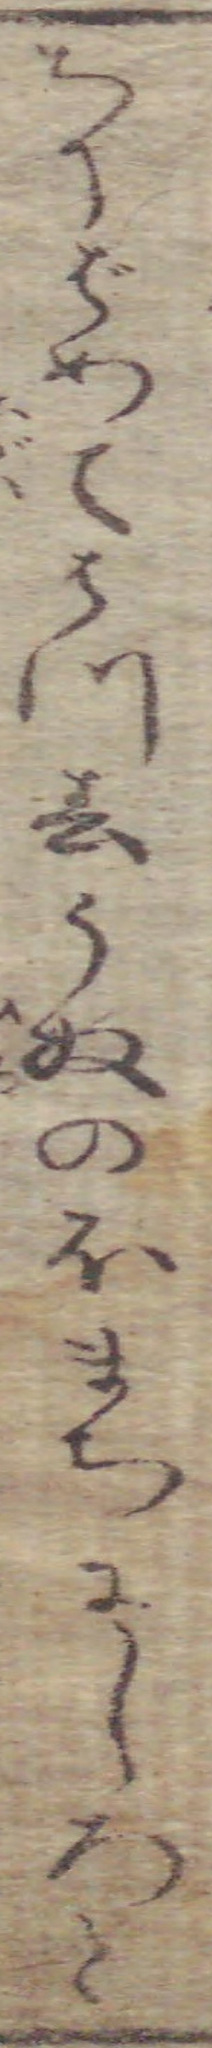ちりばめてはつ春うぬのほまちにしろと
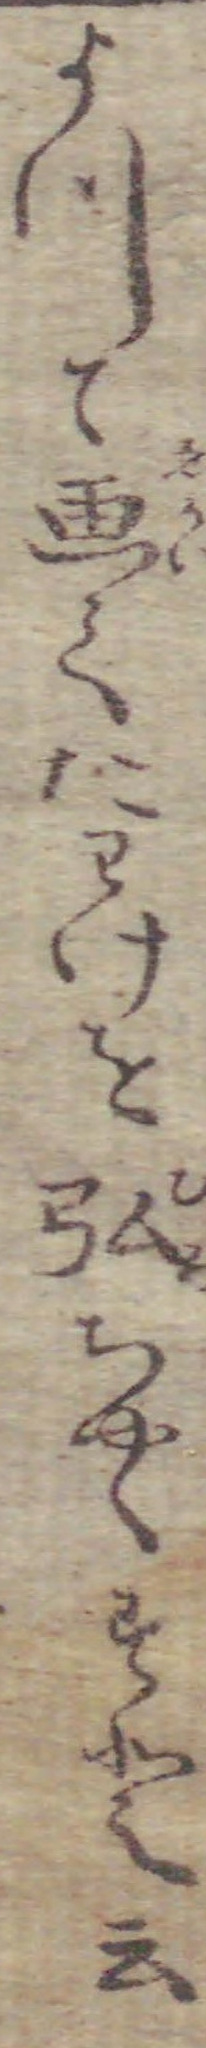よつて画てたわけを弘ちやくすと云

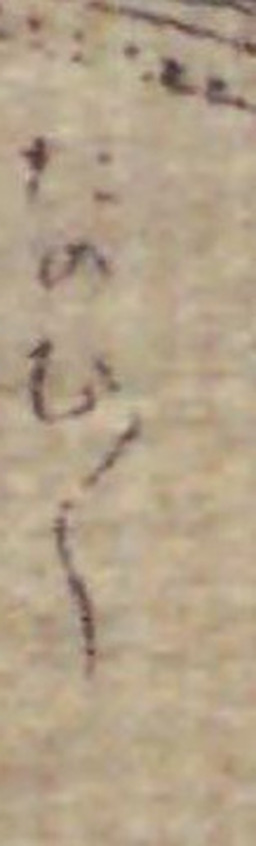たのむ〳〵
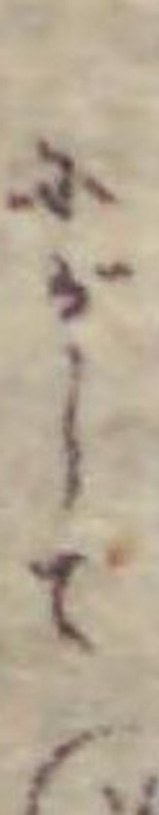にがして
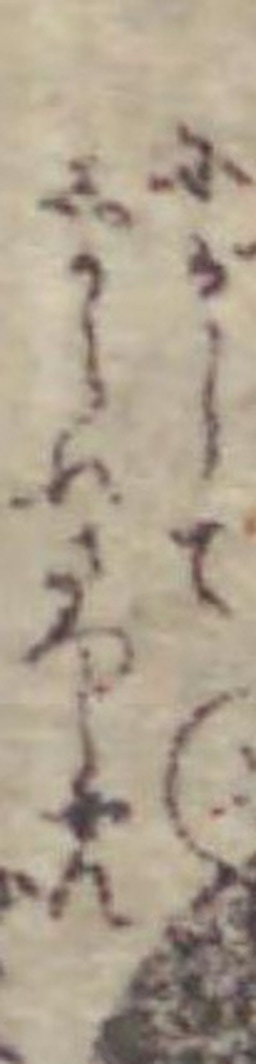しかられさつしやん
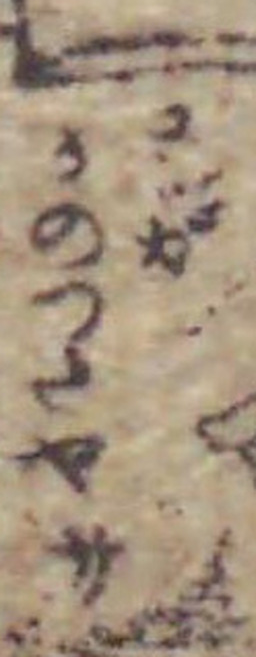かのつたやサ

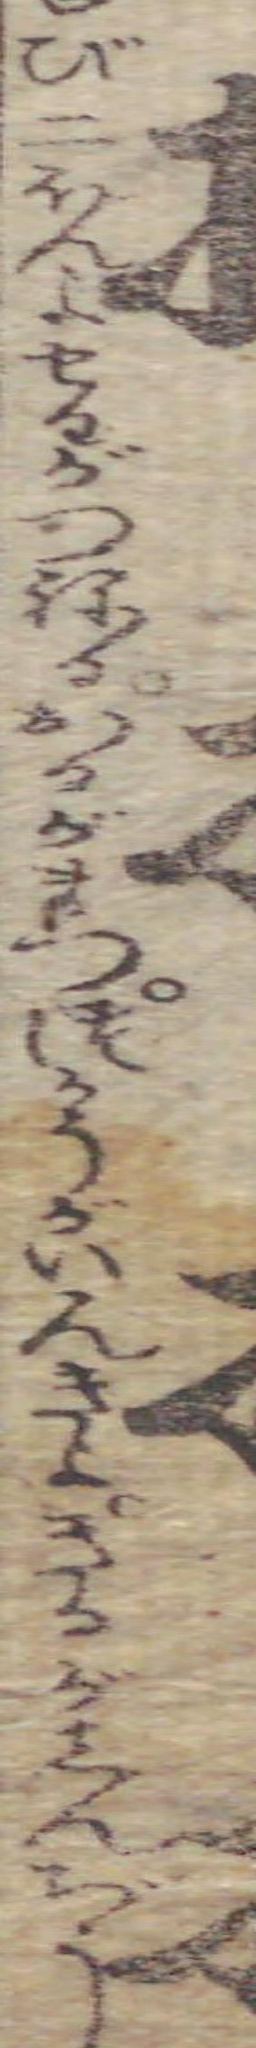ゆび二ほんよせるがつねる。かるがまつ。つかうがいんきよ。きるがしんぢう
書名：郭𦽳費字尽 : 3巻
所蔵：国立国会図書館 National Diet Library, JAPAN
